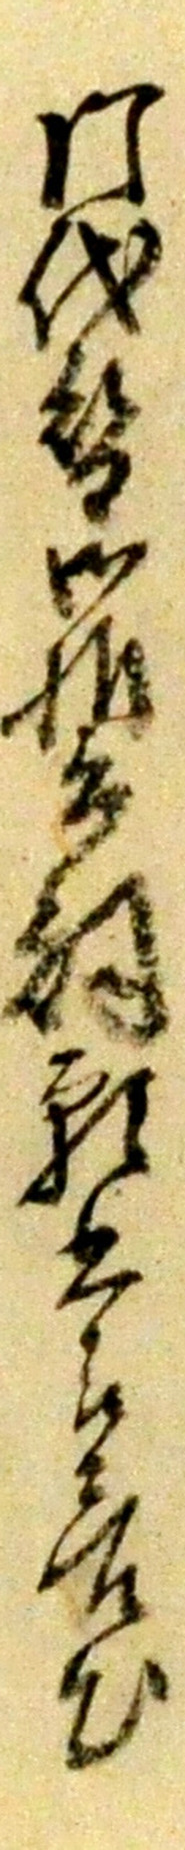御代替御誓詞願書被差出
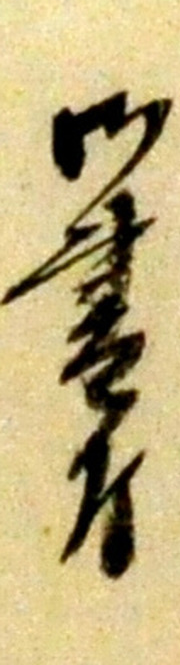御書付
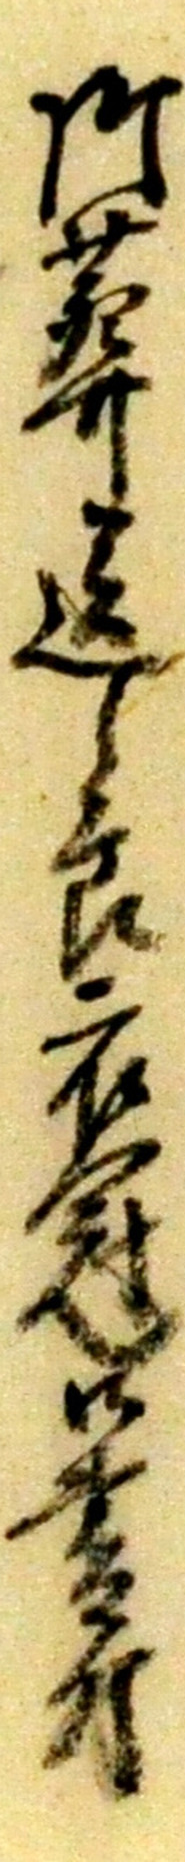御葬送之節衣冠御書付

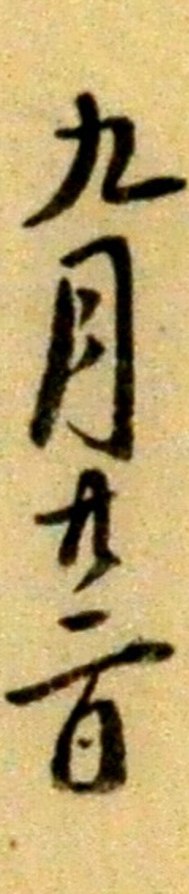九月廿二日
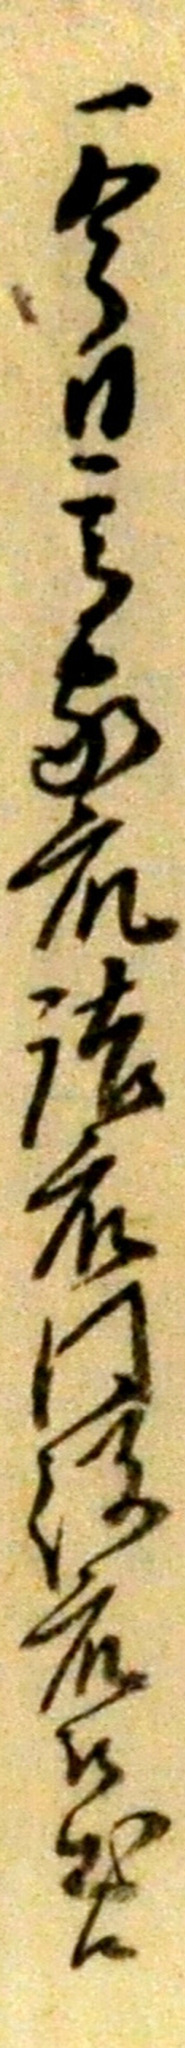一今日高家衆詰衆同役衆被出候
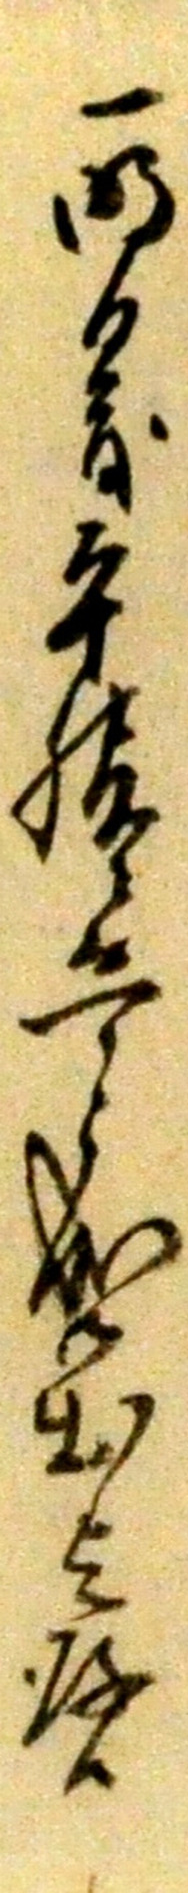一明日茂平服ニ而可被成候出与存候
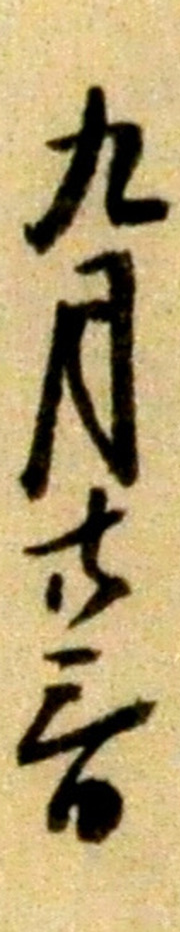九月廿三日
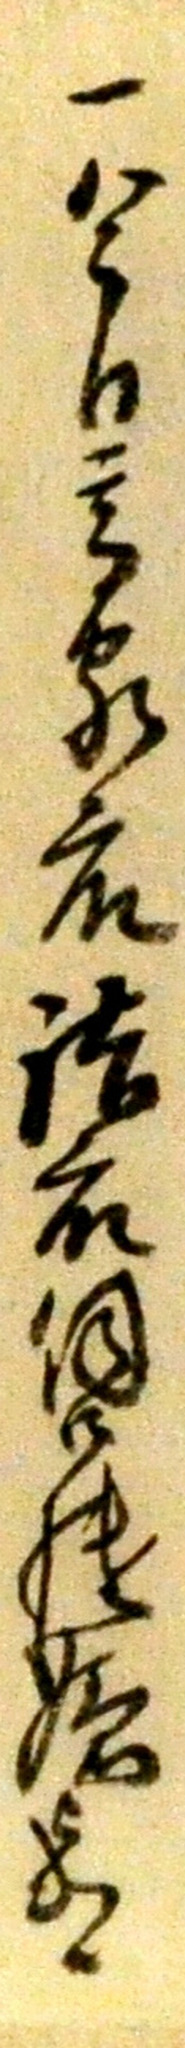一今日高家衆詰衆伺御機嫌被成候
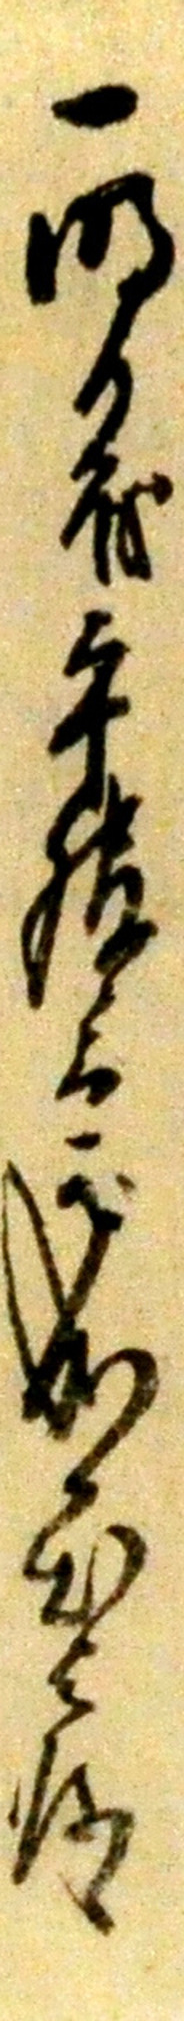一明日茂平服ニ而被成候出与存候
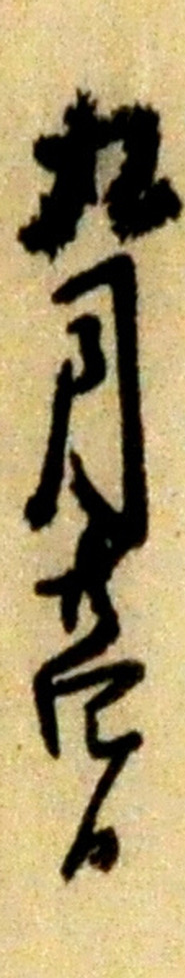九月廿四日
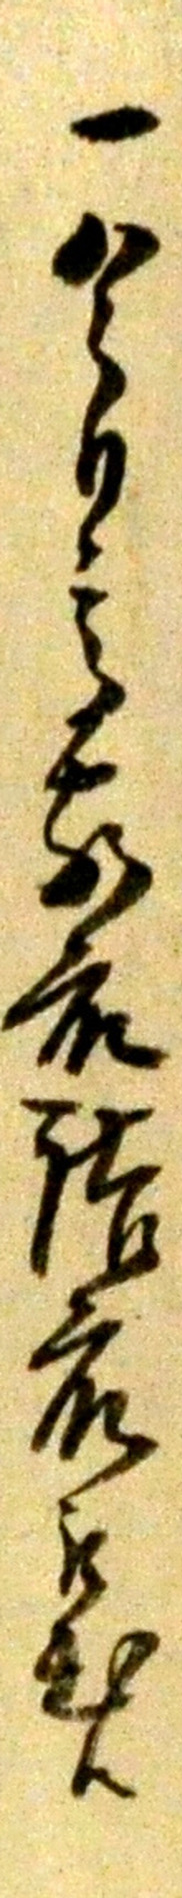一今日高家衆詰衆被出候
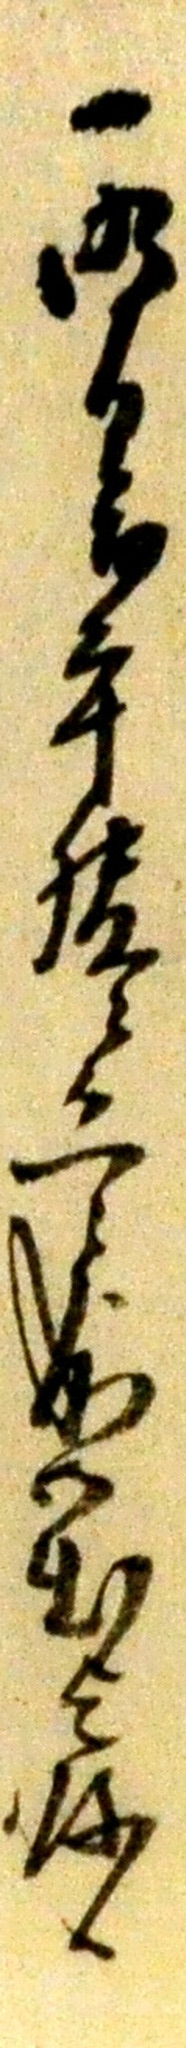一明日茂平服ニ而可被成候出与存候
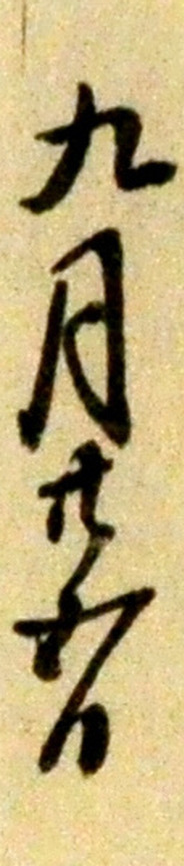九月廿五日
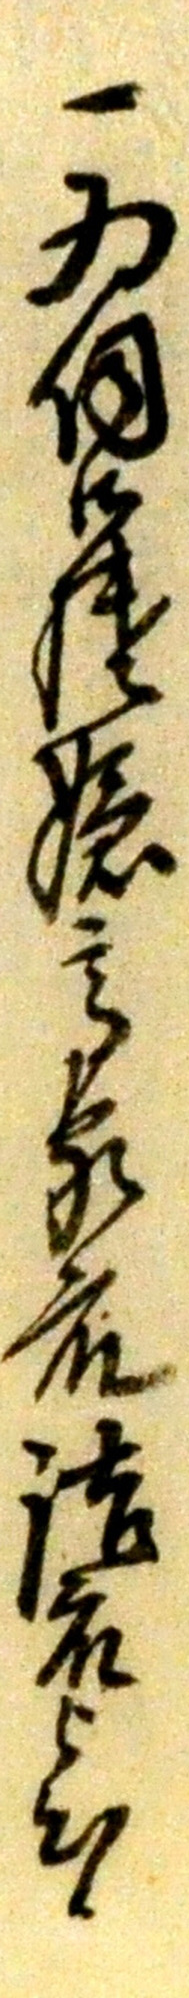一為伺御機嫌高家衆詰衆被出候
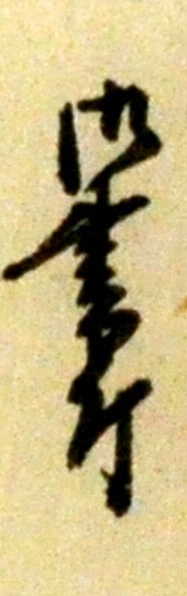御書付
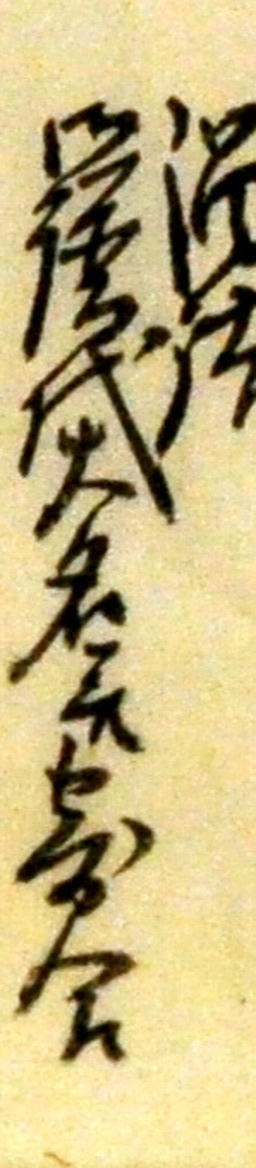御譜代大名并寄合
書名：書抜
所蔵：伊那市立高遠町図書館・合同会社AMANE
